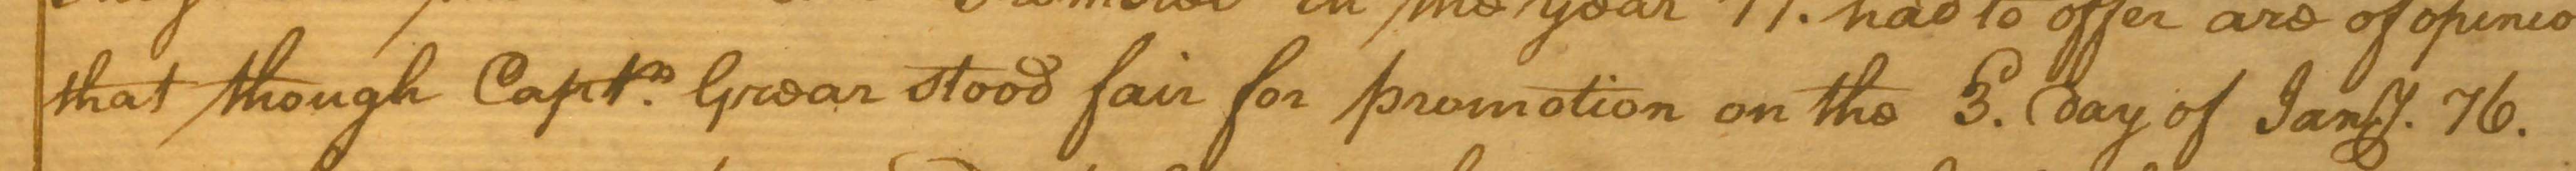that though Capt^n. Grear stood fair for promotion on the 3^d. day of Jan^y. 76.
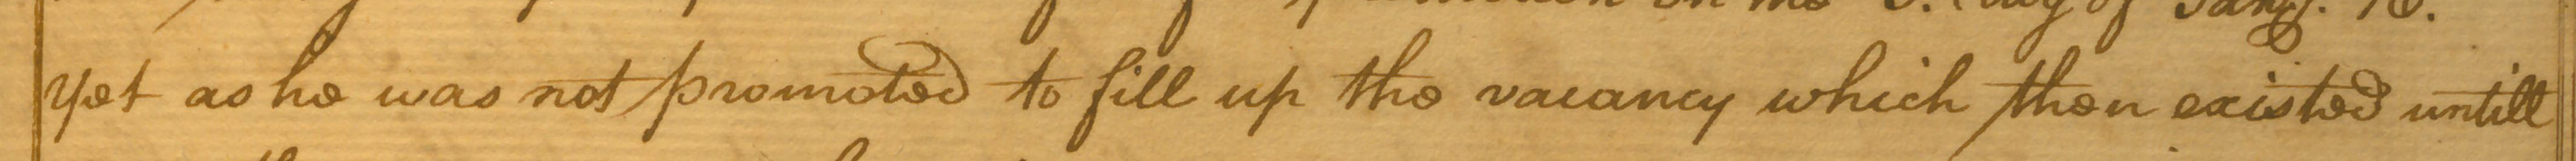yet as he was not promoted to fill up the vacancy which then existed untill
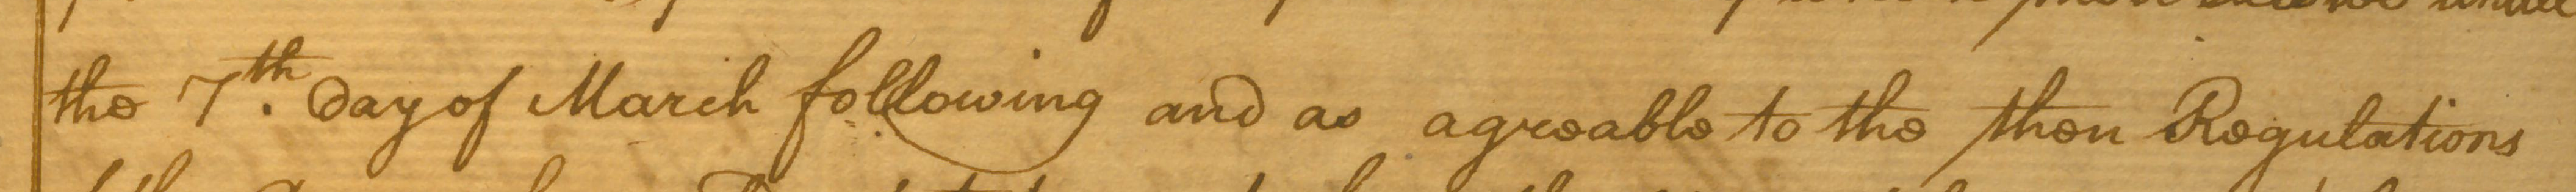the 7^th. day of March following and as agreable to the then Regulations
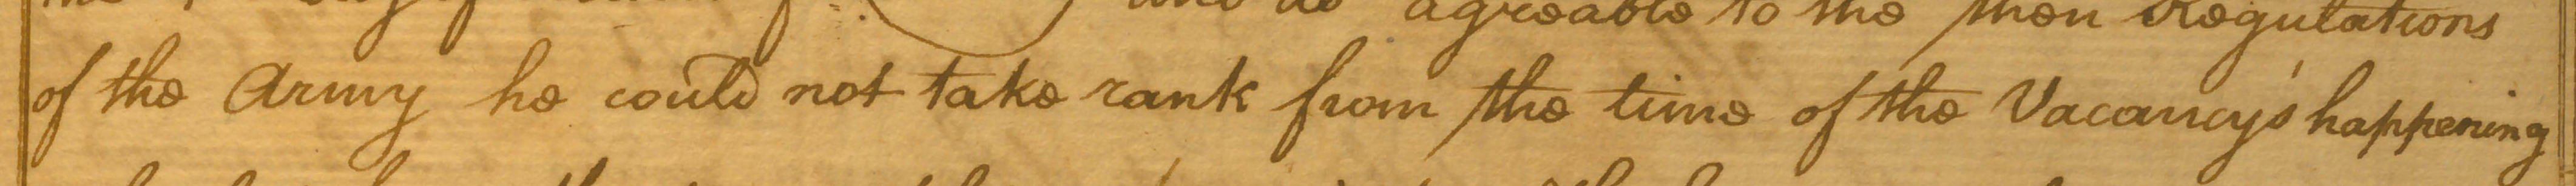of the Army he could not take rank from the time of the Vacancy's happening
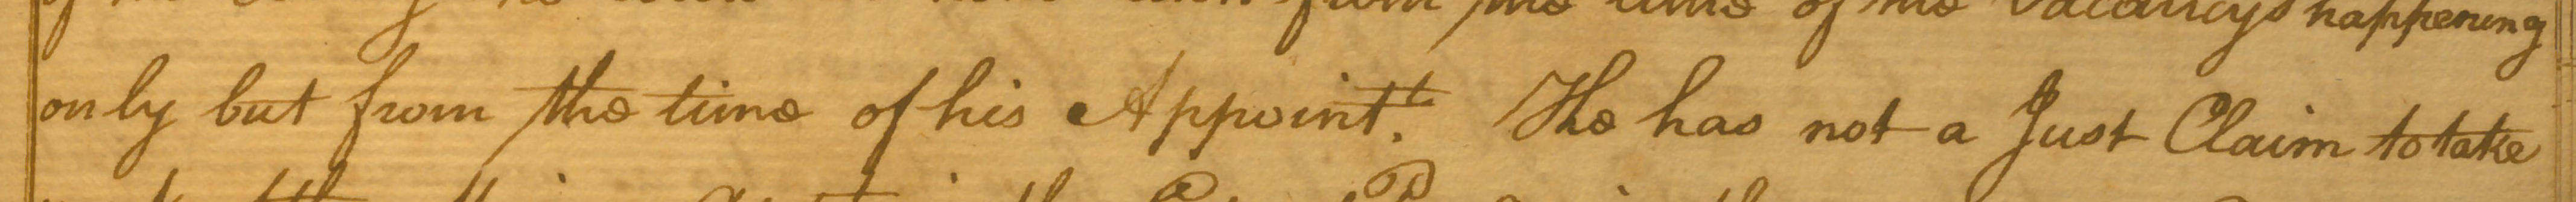only but from the time of his Appoint^t. He has not a Just Claim to take
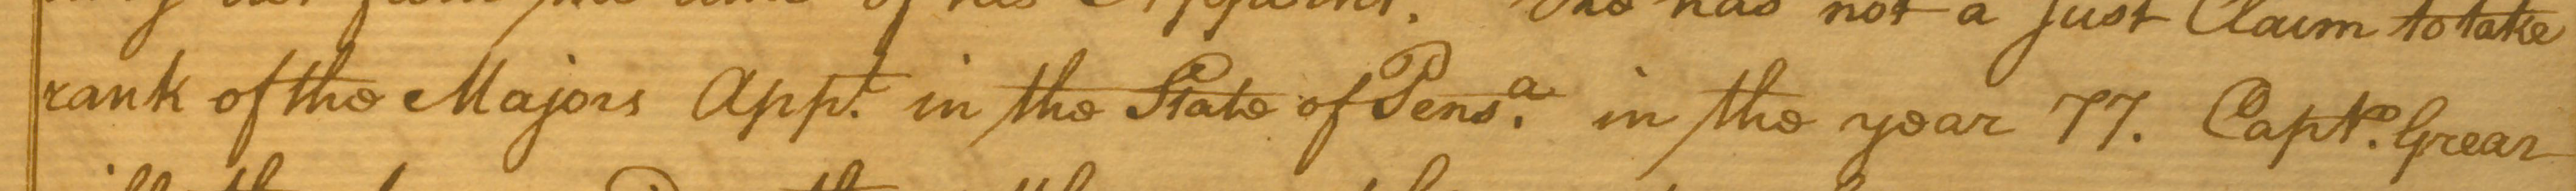rank of the Majors App^t. in the State of Pens^a. in the year 77. Capt^n. Grear
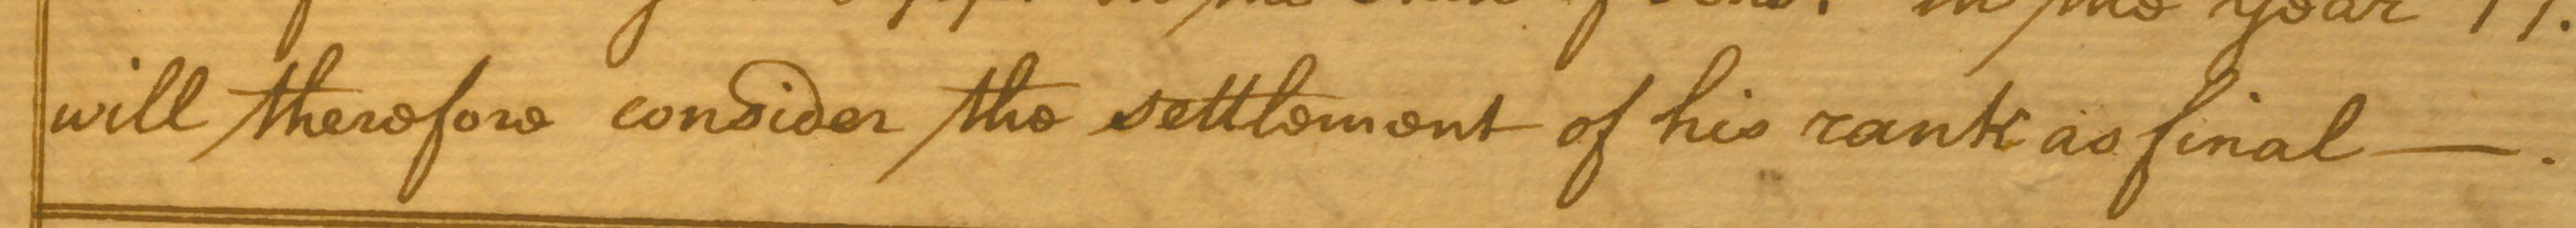will therefore consider the settlement of his rank as final-
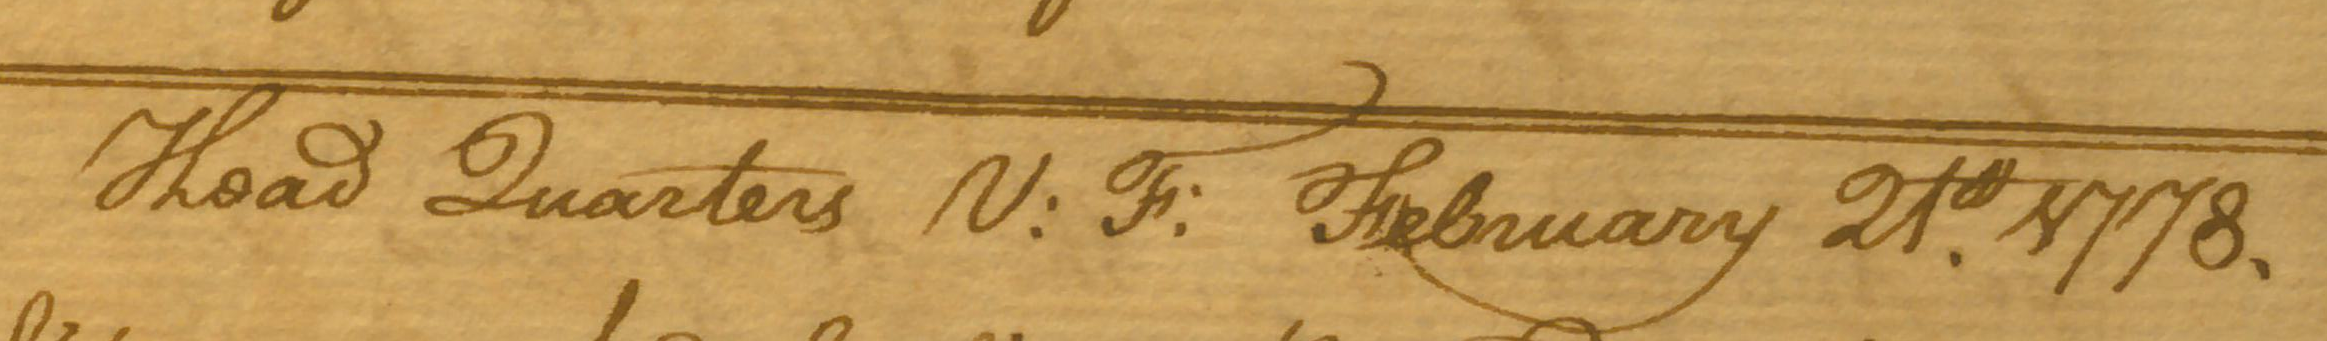Head Quarters V: F: February 21^st. 1778.
